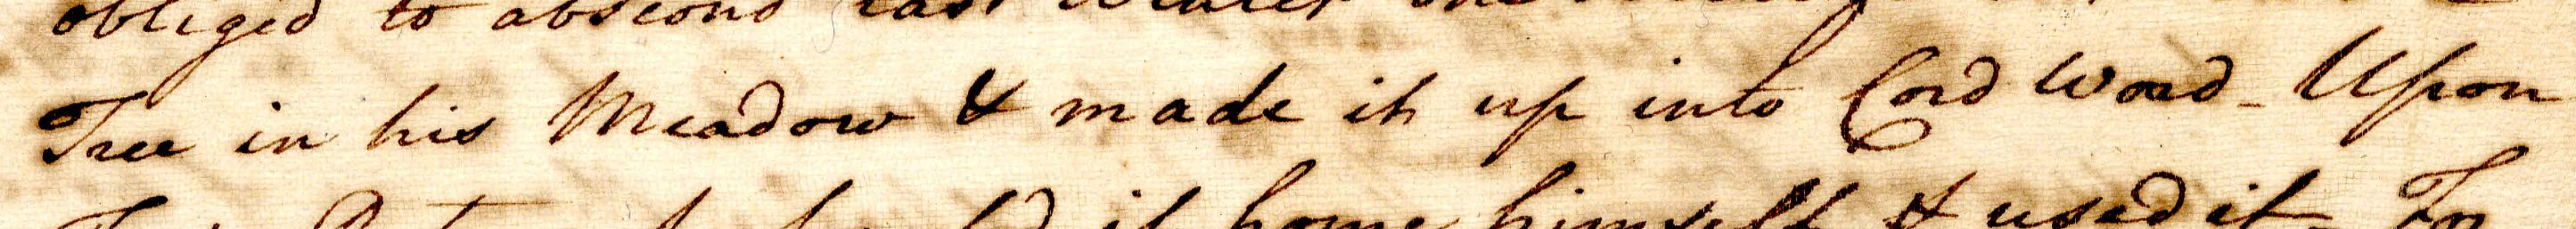Tree in his Meadow & made it up into Cord wood- Upon
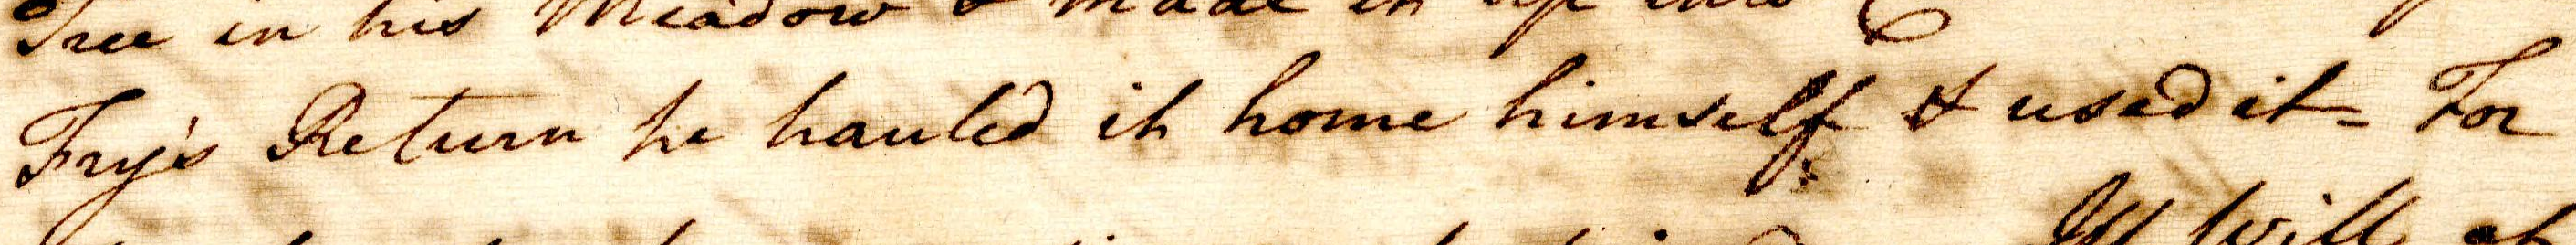Fry's Return he hauled it home himself & used it- For
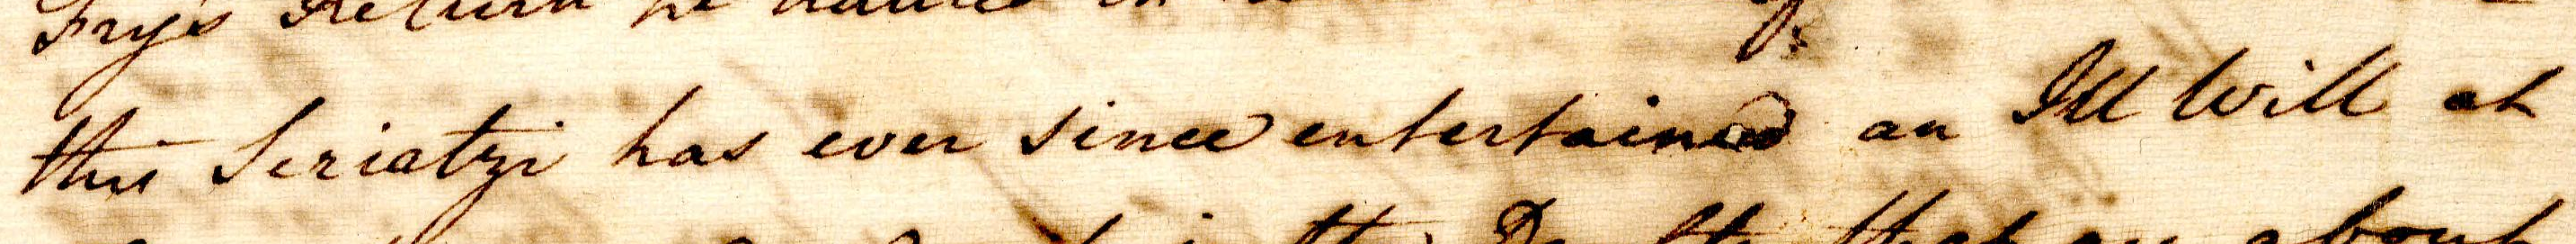this Seriatze has ever since entertained an Ill Will at
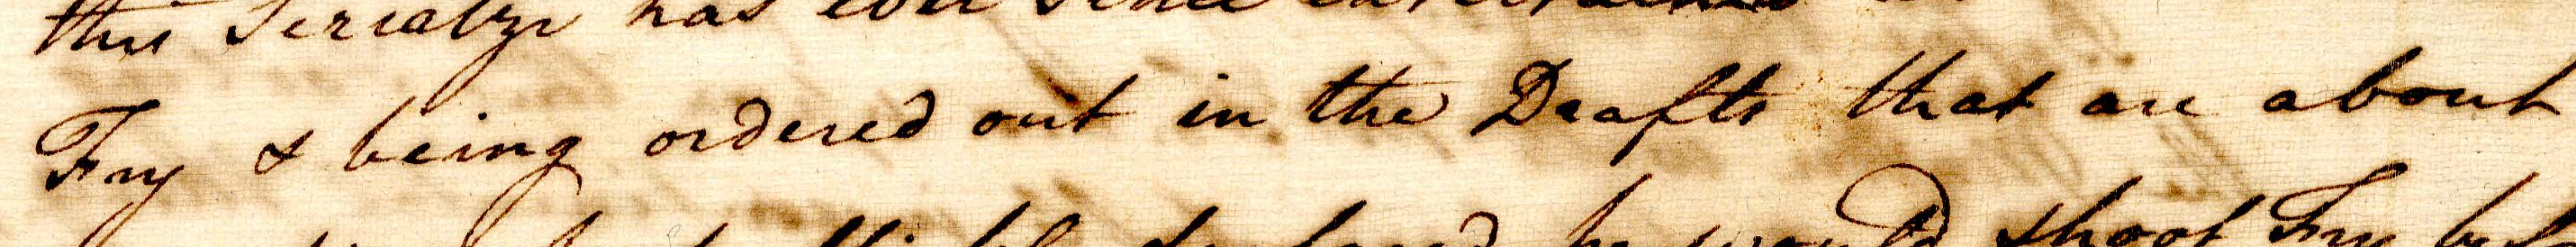Fry & being ordered out in the Drafts that are about
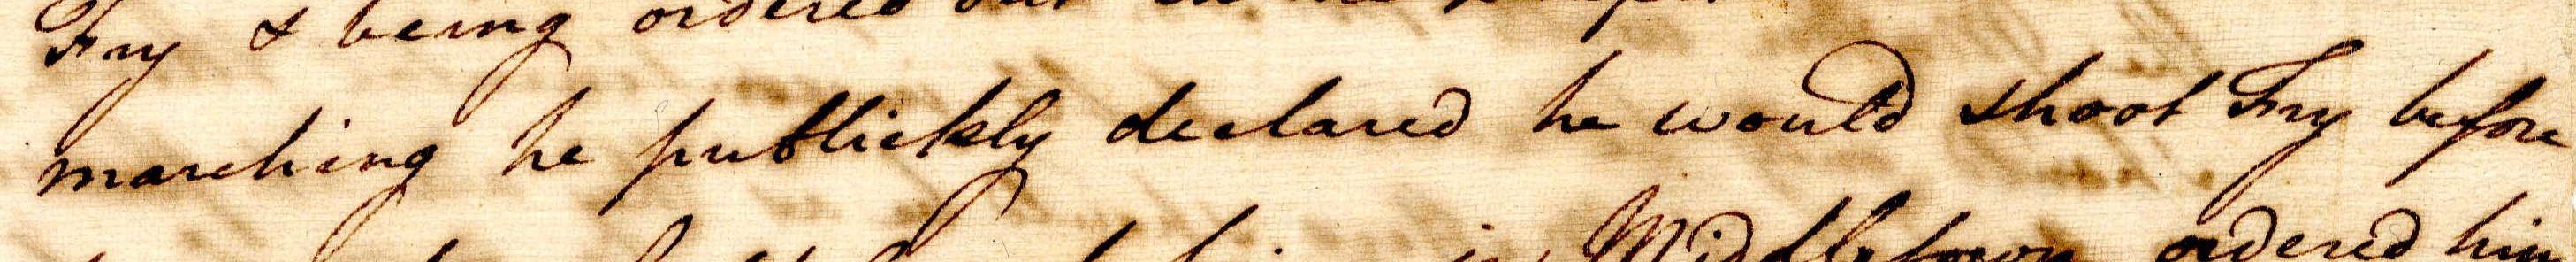marching he publickly declared he would shoot Fry before
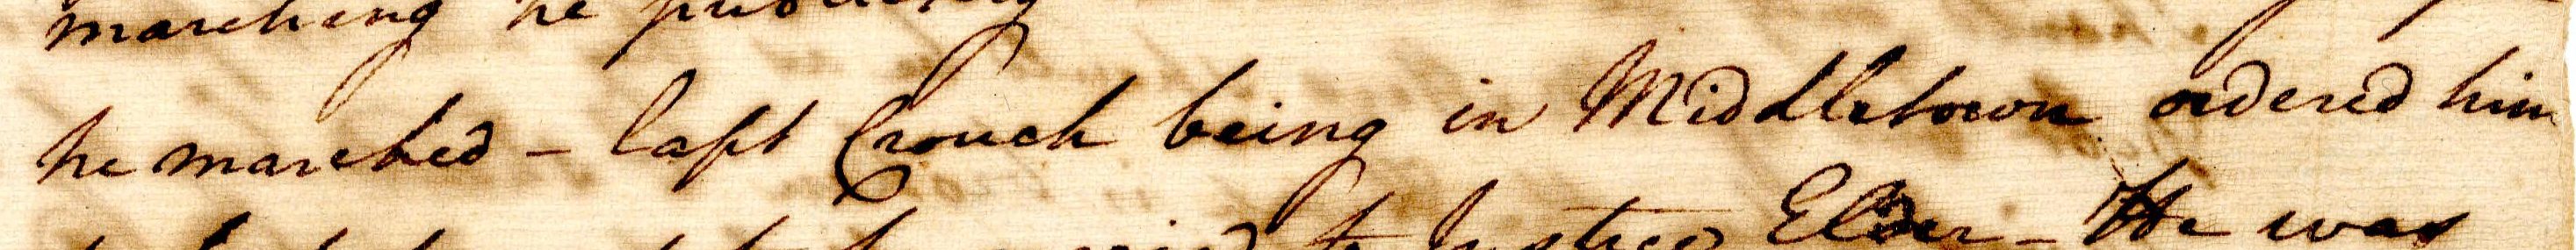he marched- Capt Crouch being in Middletown ordered him
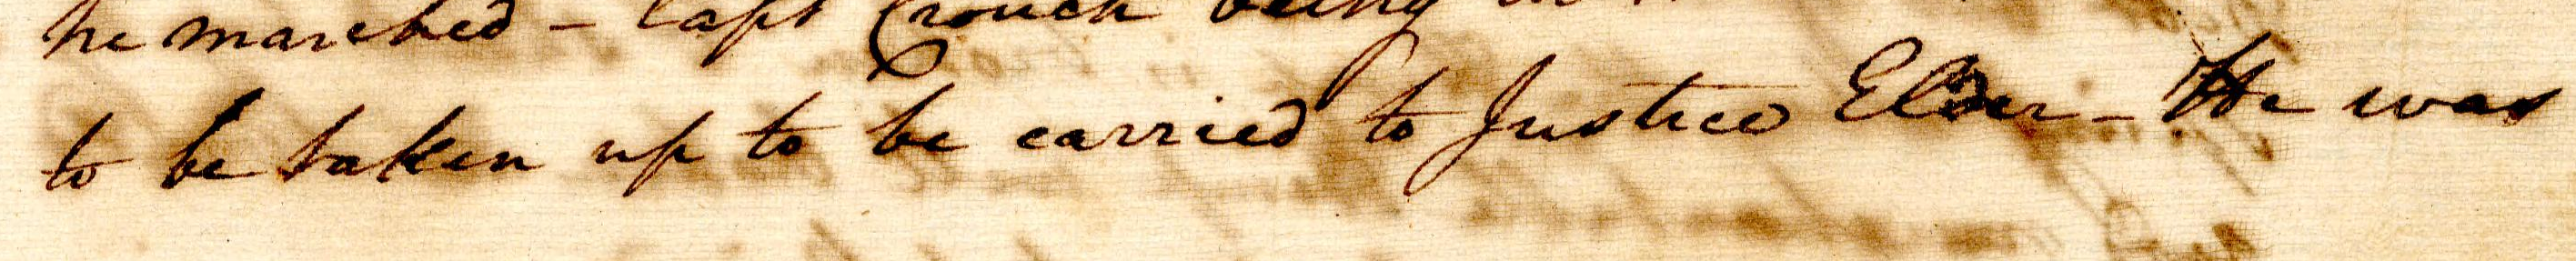to be taken up to be carried to Justice Elder- He was
